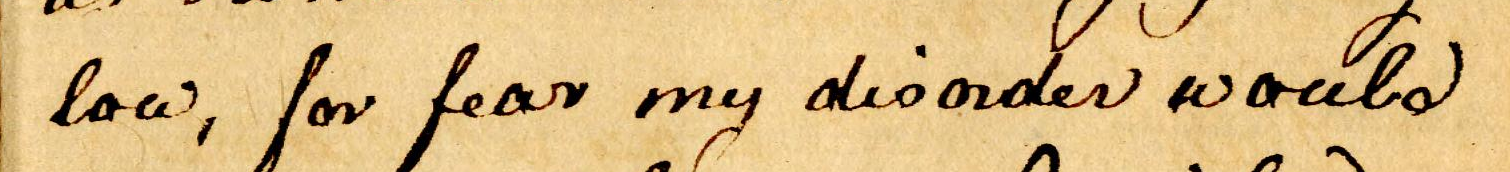law, for fear my disorder would
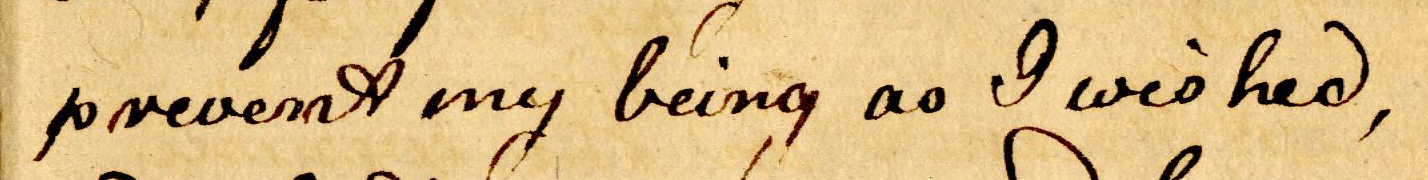prevent my being as I wished,
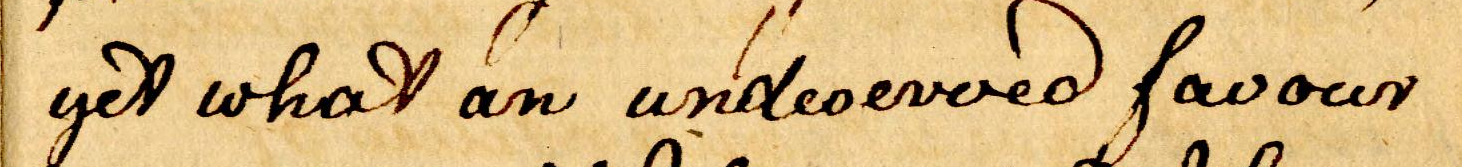yet what an undeserved favour
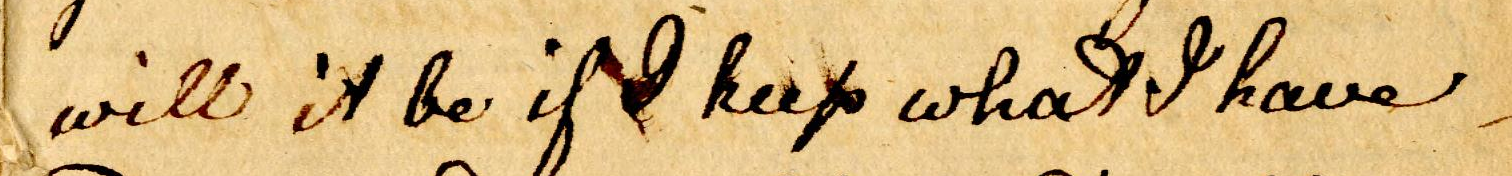will it be if I keep what I have
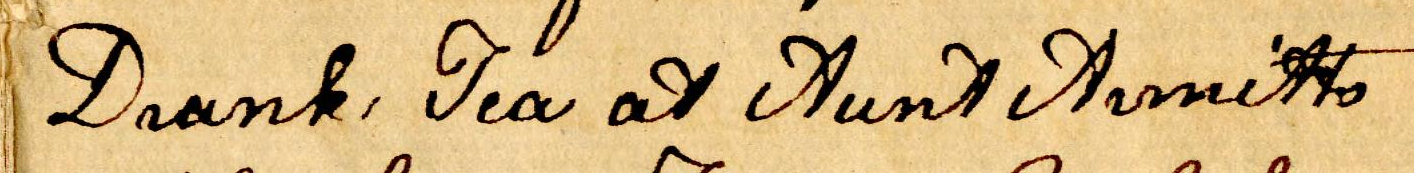Drank, Tea at Aunt Armitts
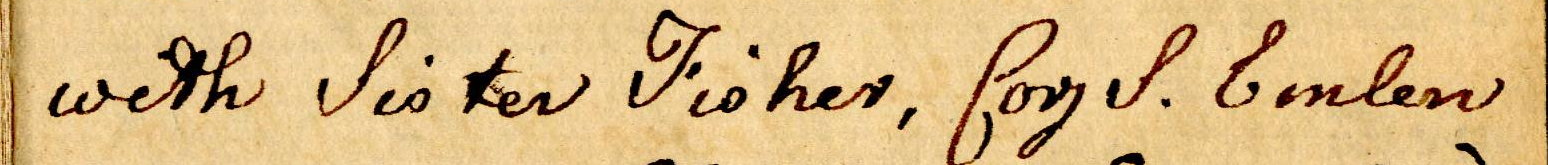with Sister Fisher, Coz S. Emlen
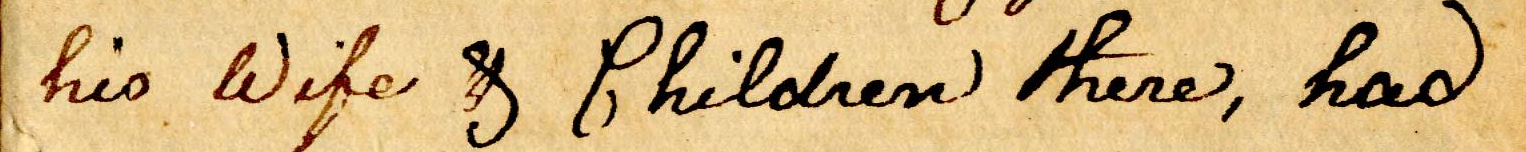his Wife & Children there, had
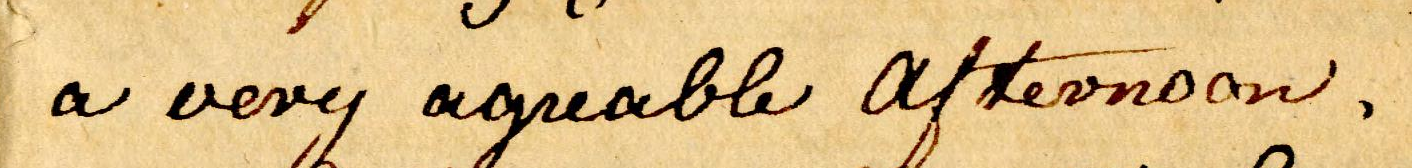a very agreable Afternoon,
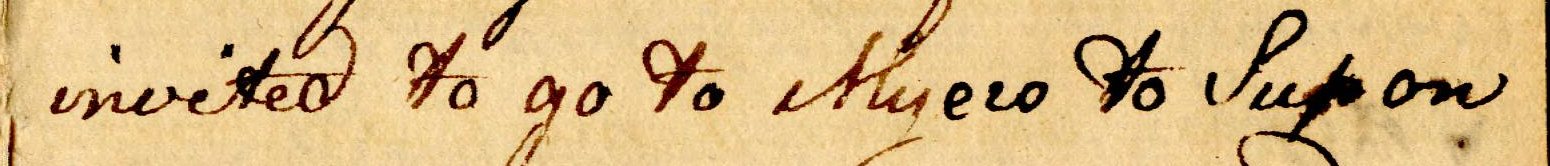invited to go to Myers to Sup on
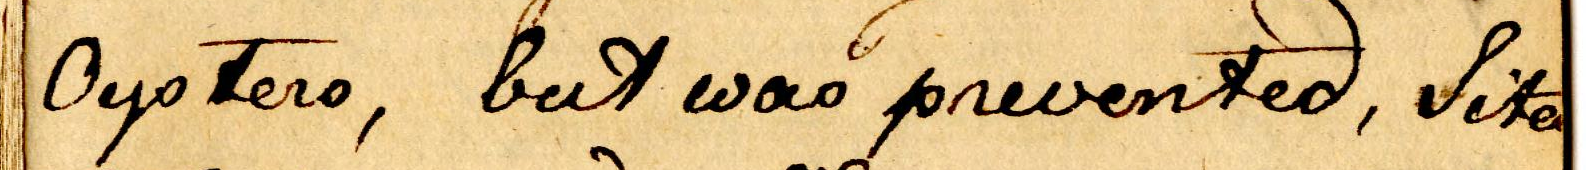Oysters, but was prevented, Site
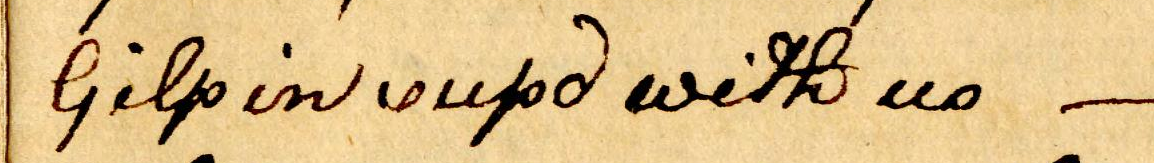Gilpin supd with us-
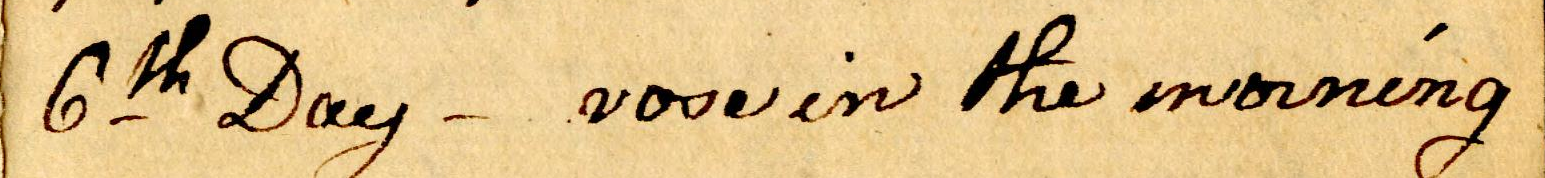6^th. Day- rose in the morning
